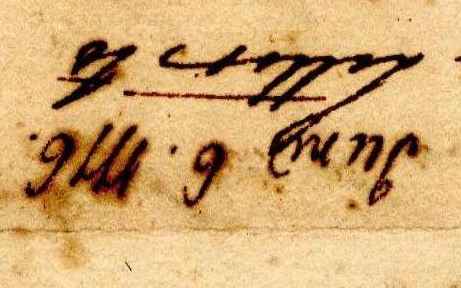June 6 1776
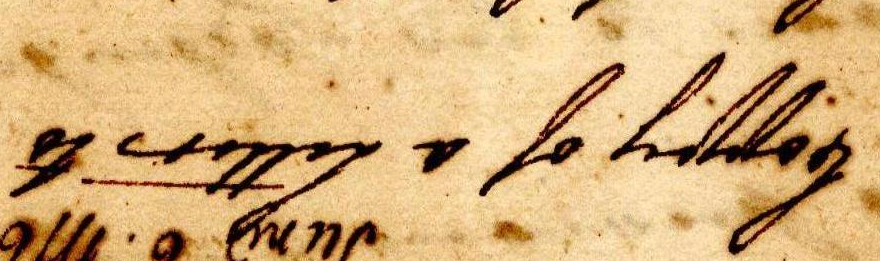Coppy of a Letter to
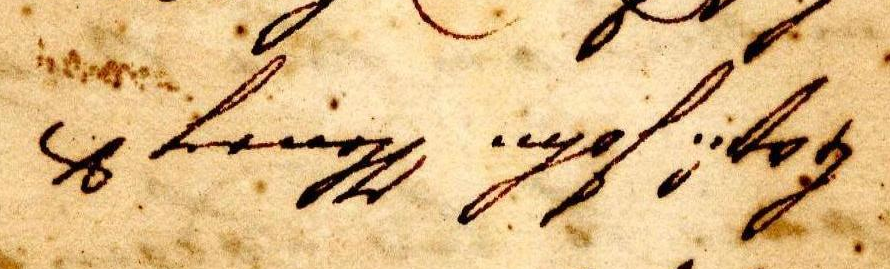Cap^t. John Henry &
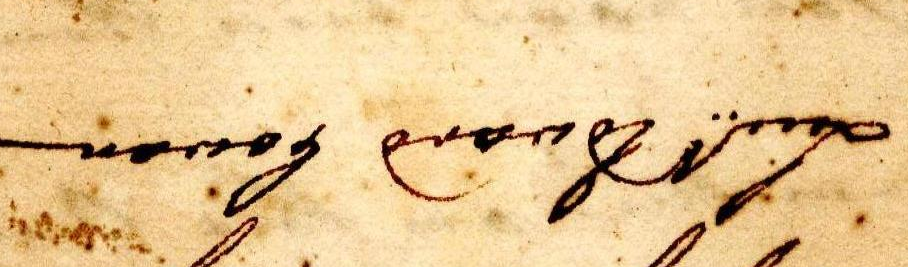Lieu^t. Edward Cowan
